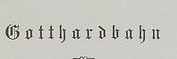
Gotthardbahn
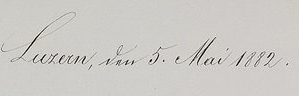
Luzern, den 5. Mai 1882.
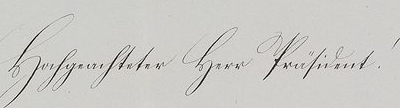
Hochgeachteter Herr Präsident!
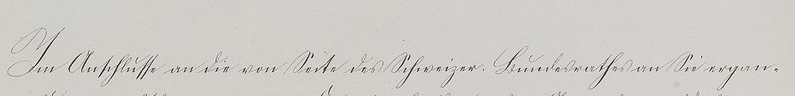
Im Anschlusse an die von Seite des Schweizer. Bundesrathes an Sie ergan-
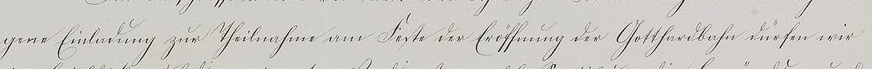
gene Einladung zur Theilnahme am Feste der Eröffnung der Gotthardbahn dürfen wir
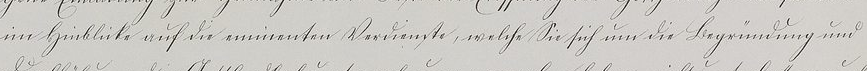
im Hinblicke auf die eminenten Verdienste, welche Sie sich um die Begründung und
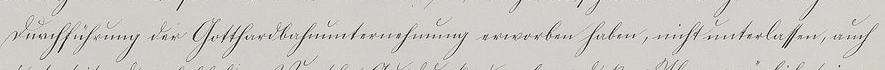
Durchführung der Gotthardbahnunternehmung erworben haben, nicht unterlassen, auch
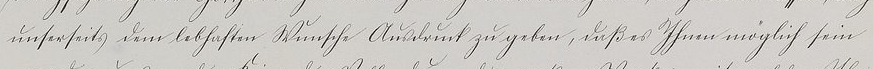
unserseits dem lebhaften Wunsche Ausdruck zu geben, daß es Ihnen möglich sein
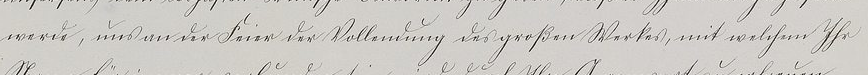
werde, uns an der Feier der Vollendung des grossen Werkes, mit welchem Ihr
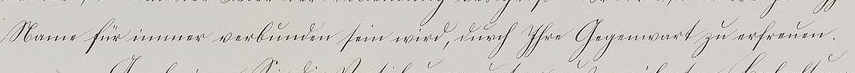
Name für immer verbunden sein wird, durch Ihre Gegenwart zu erfreuen.
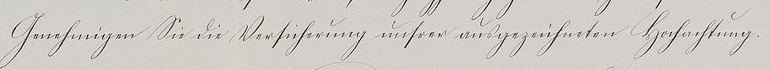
Genehmigen Sie die Versicherung unsrer ausgezeichneten Hochachtung.
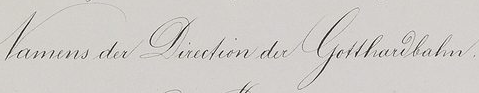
Namens der Direction der Gotthardbahn.
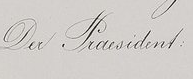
Der Präsident:
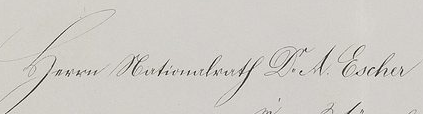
Herrn Nationalrath Dr A. Escher
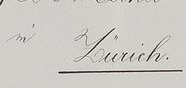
in Zürich.
